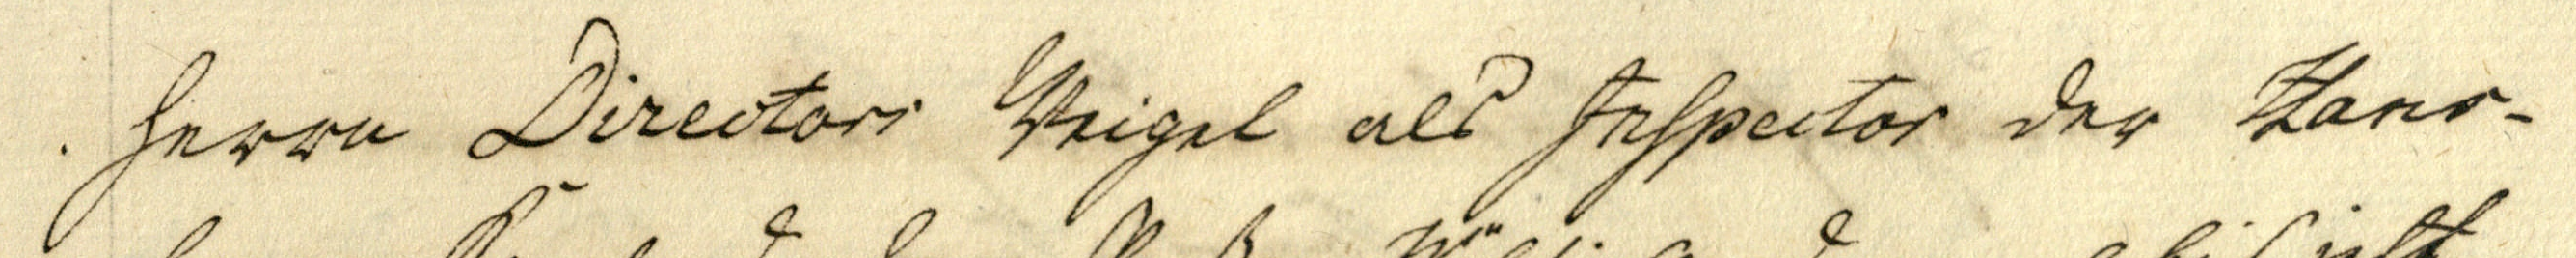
Herrn Directors Weigel als Inspector der Hans-
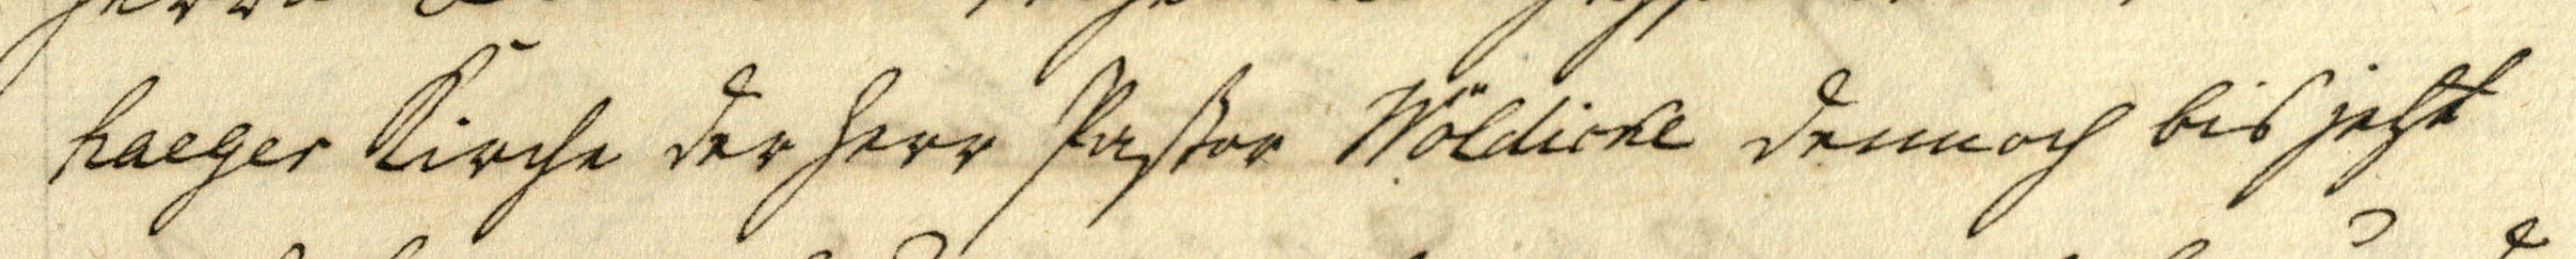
haeger Kirche der Herr Pastor Wöldicke dennoch bis jetzt
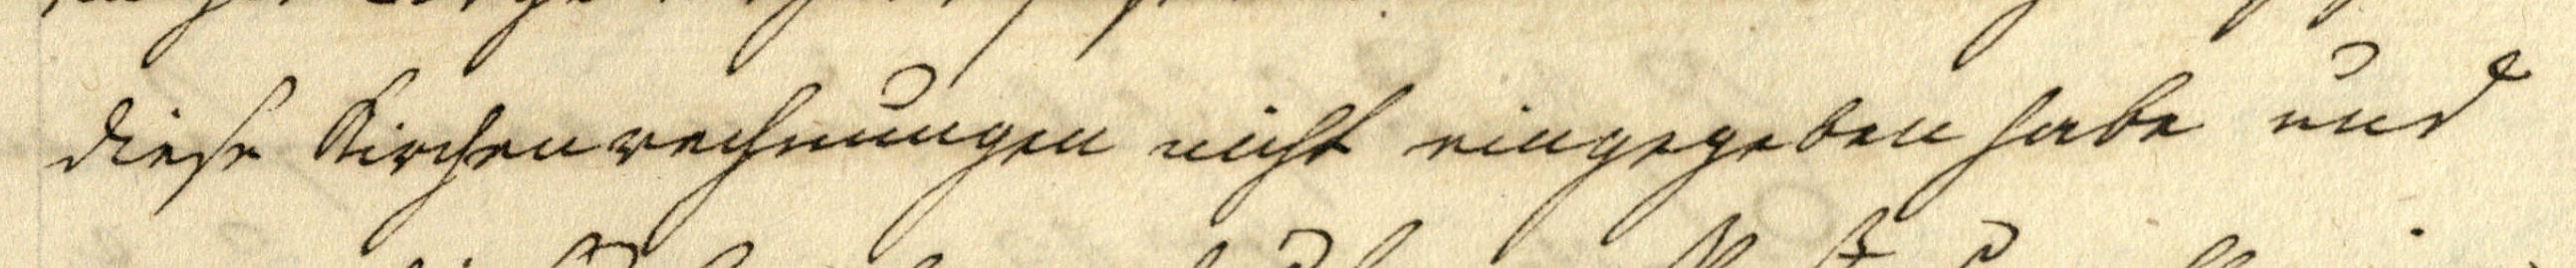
diese Kirchenrechnungen nicht eingegeben habe und
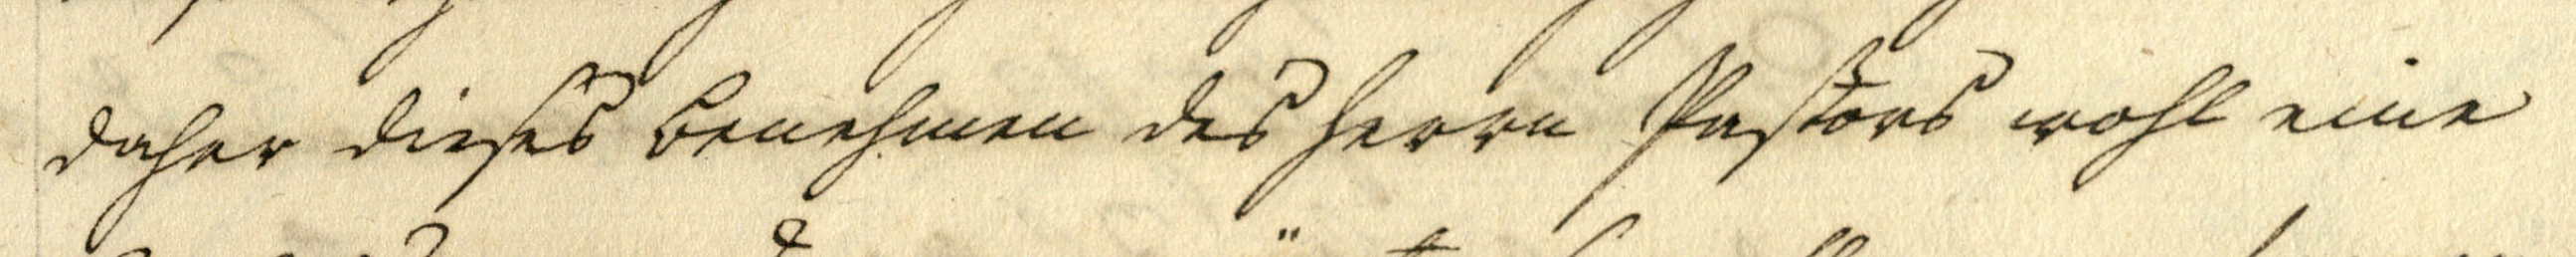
daher dieses Benehmen des Herrn Pastors wohl eine
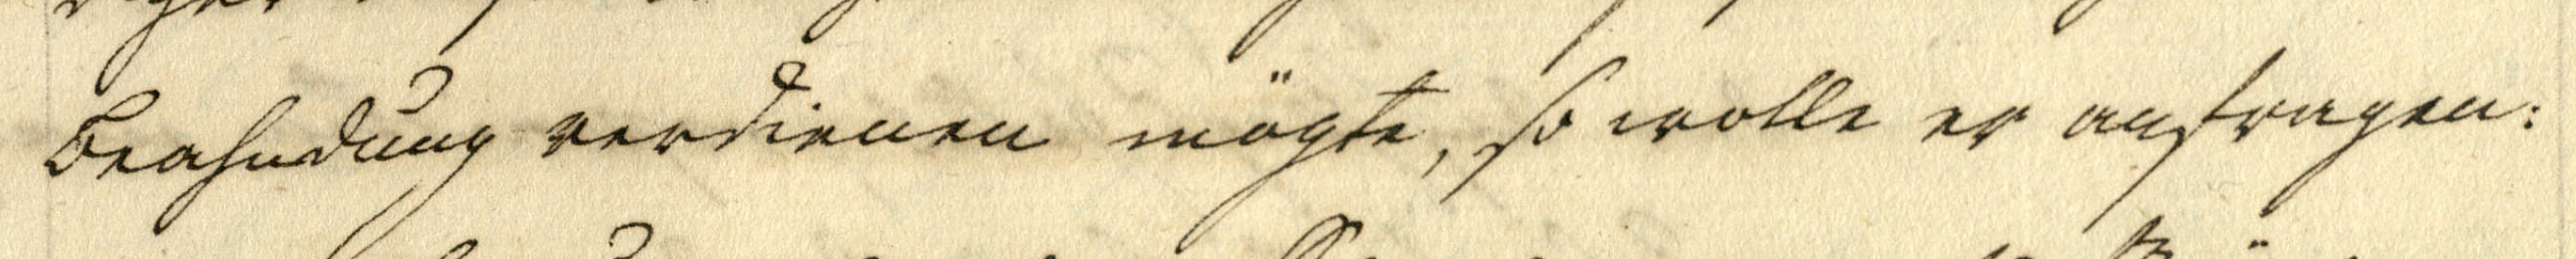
Beahndung verdienen mögte, so wolle er anfragen:
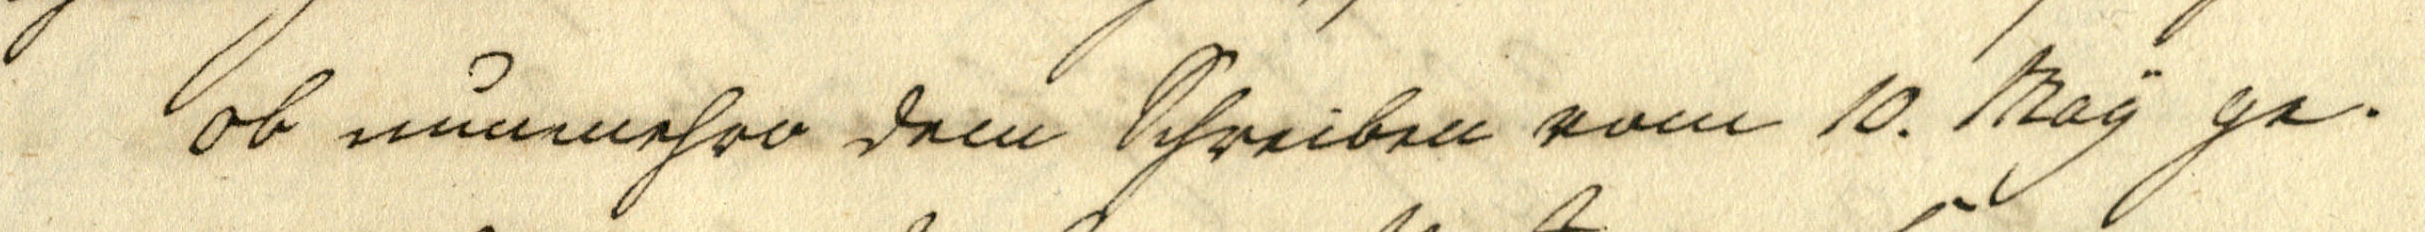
ob nunmehro dem Schreiben vom 10. May ge-
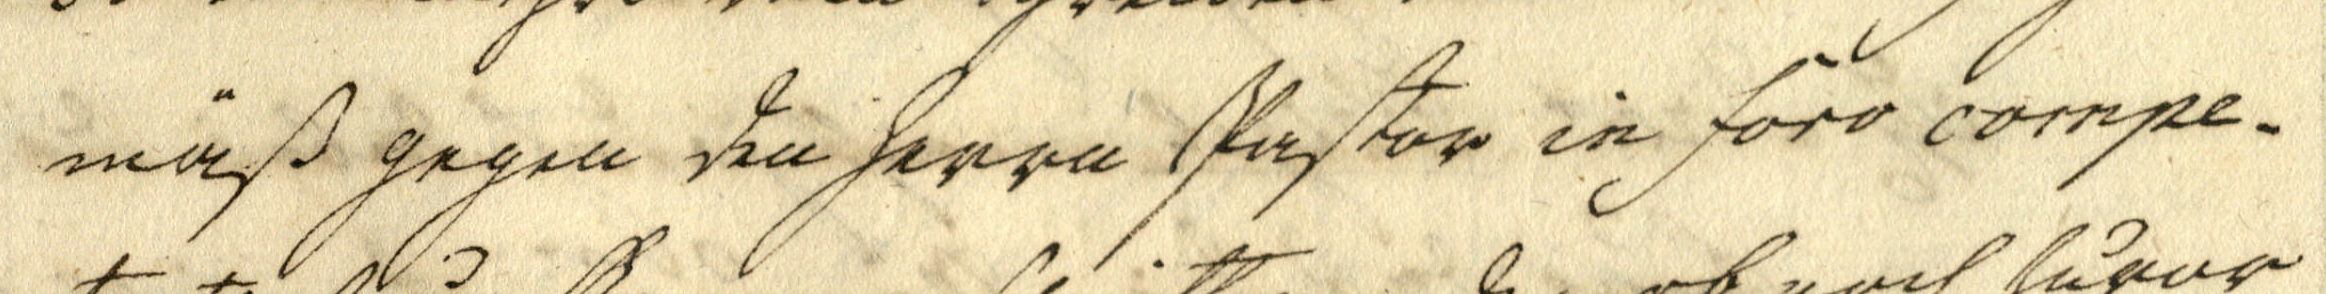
mäß gegen den herrn Pastor in foro compe-
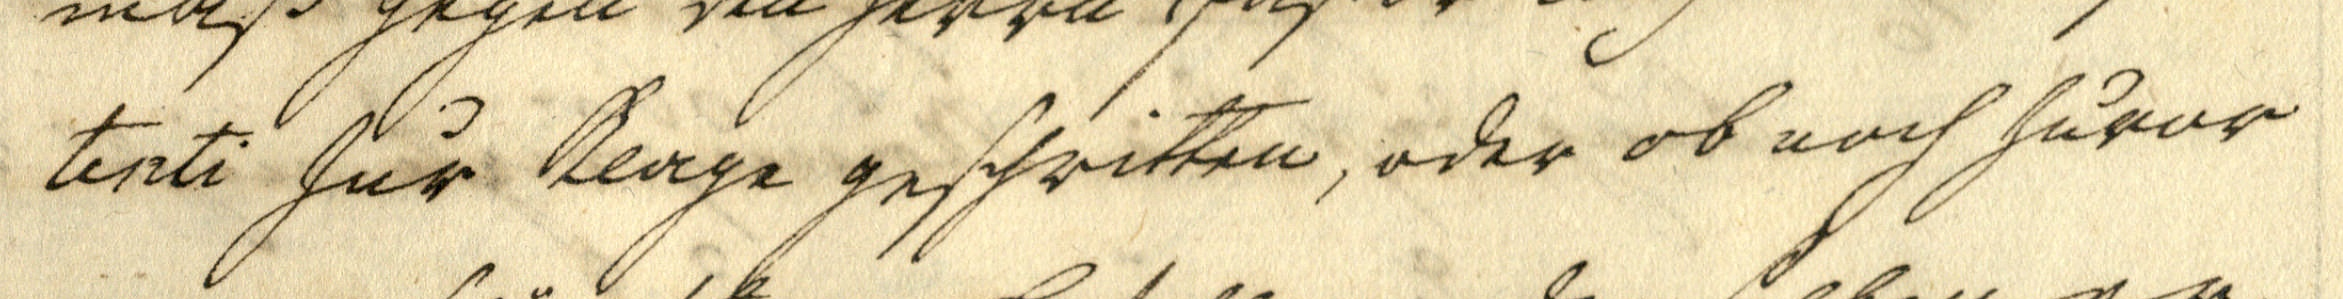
tenti zur Klage geschritten, oder ob noch zuvor
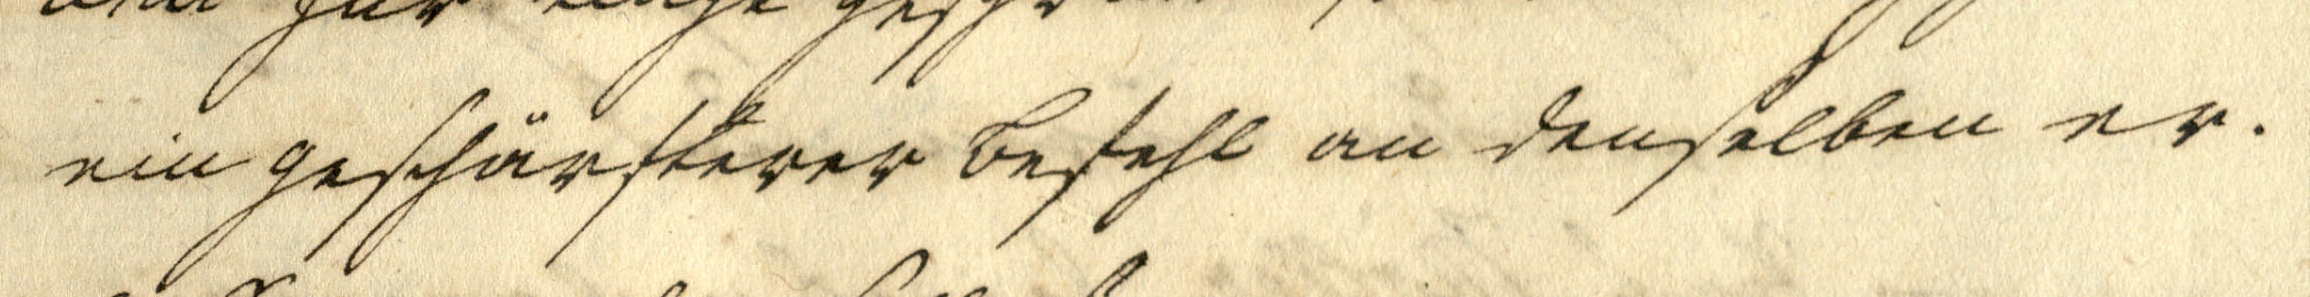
ein geschärfterer Befehl an denselben er-
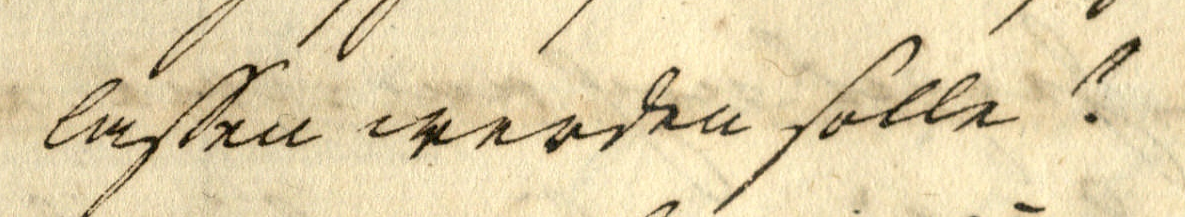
lassen werden solle?
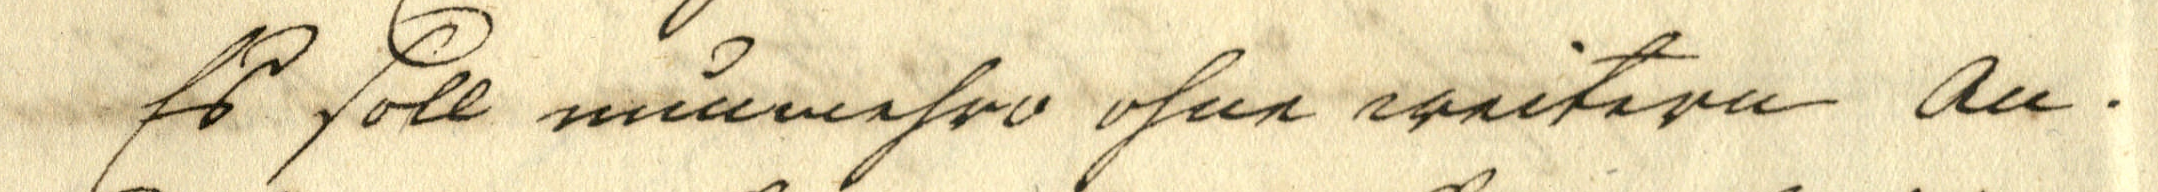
Es soll nunmehro ohne weitern An-
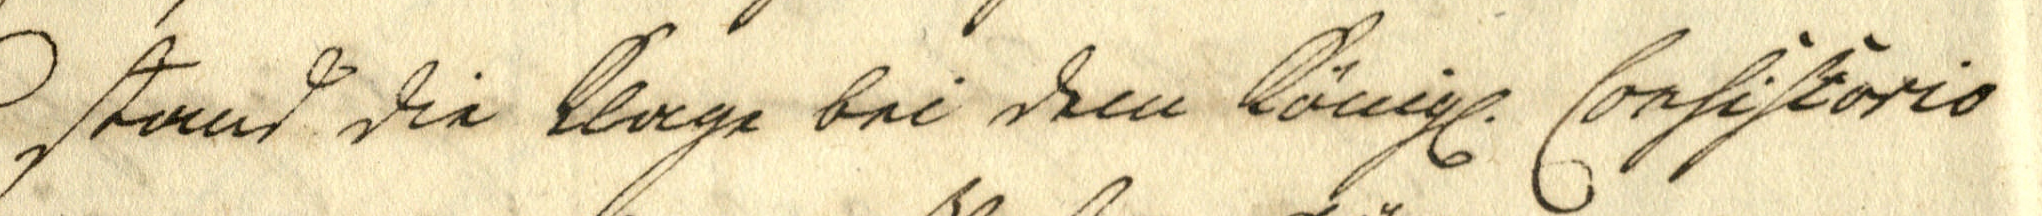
stand die Klage bei dem Königl. Consistorio
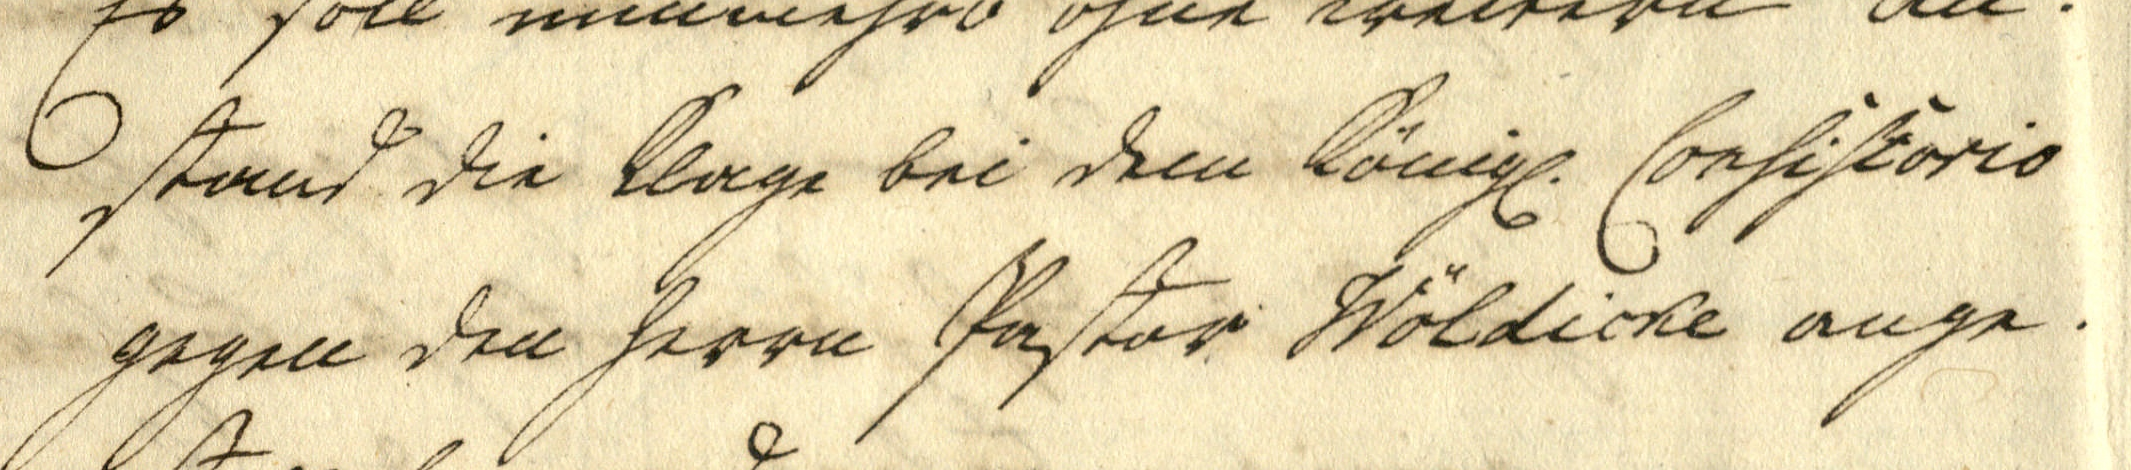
gegen den Herrn Pastor Wöldicke ange-
